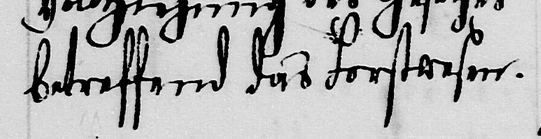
betreffend das Fortswesen
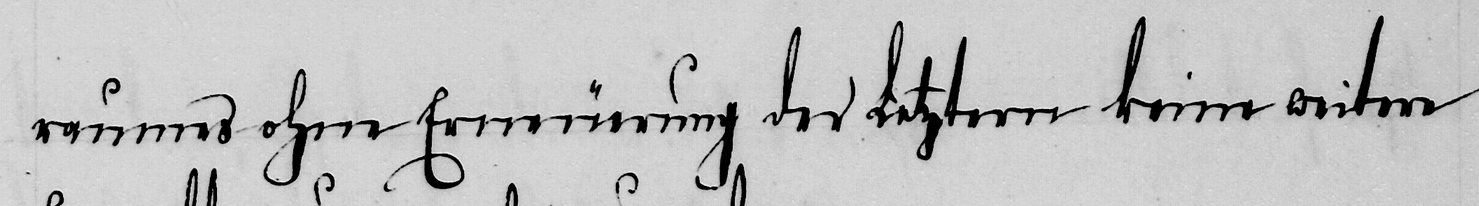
raumes ohne Erneuerung der Letztern keine weitere
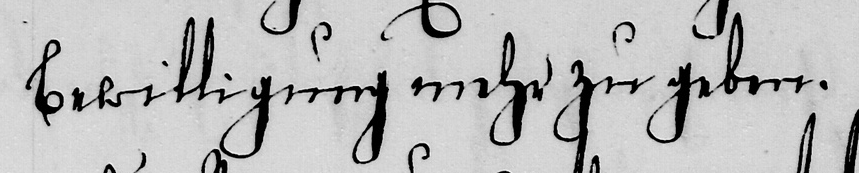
Bewilligung mehr zu geben.
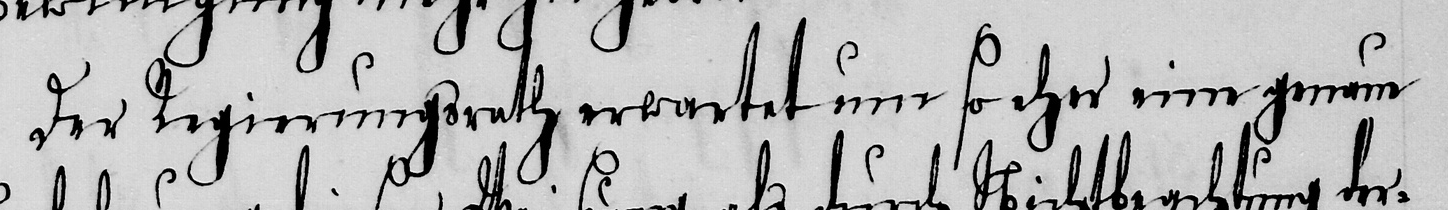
Der Regierungsrath erwartet um so eher eine genaue
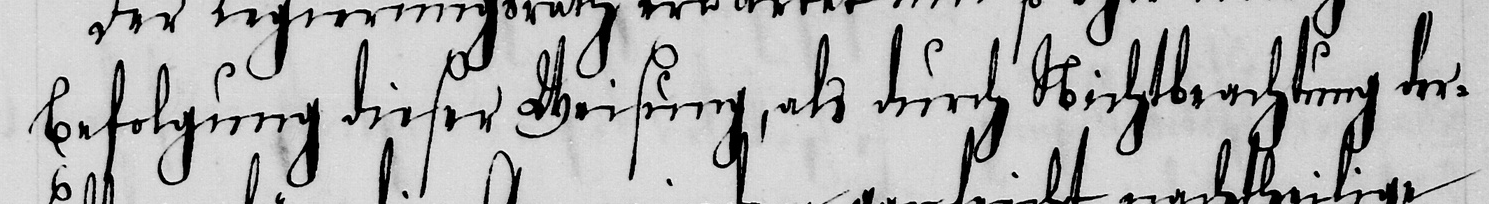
Befolgung dieser Weisung, als durch Nichtbeachtung der¬
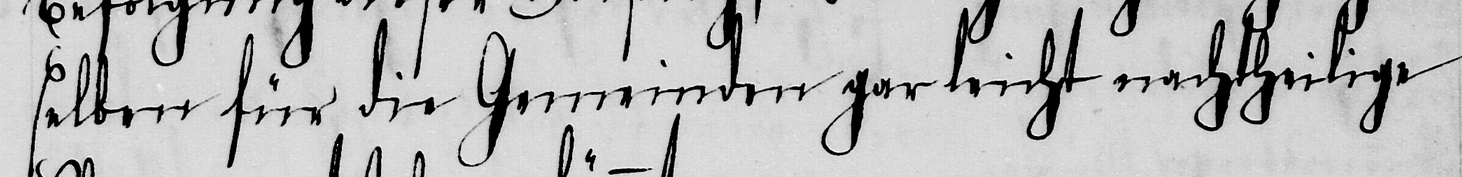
selben für die Gemeinden gar leicht nachtheilige
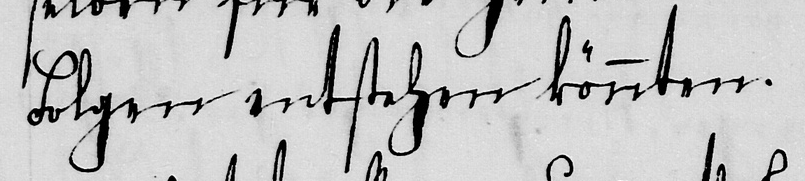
Folgen entstehen könnten.
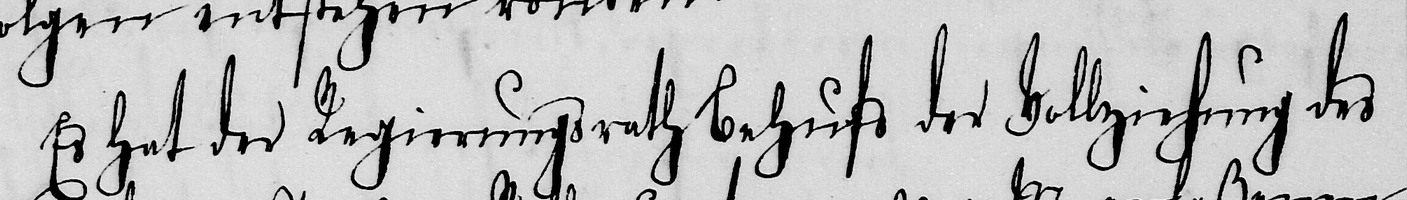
Es hat der Regierungsrath Behufs der Vollziehung des
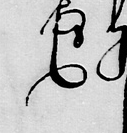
1.)
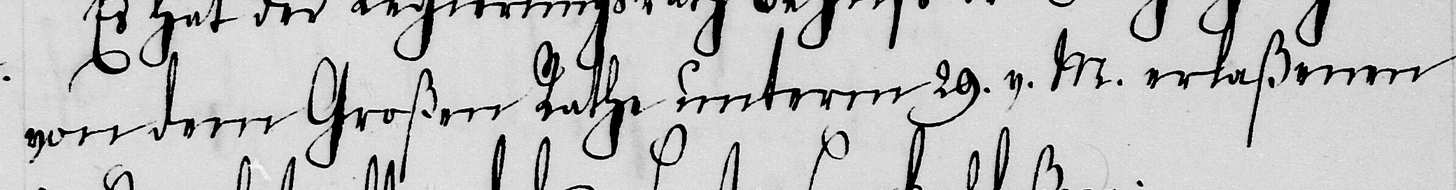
von dem Großen Rathe unterm 29. v. M. erlaßenen
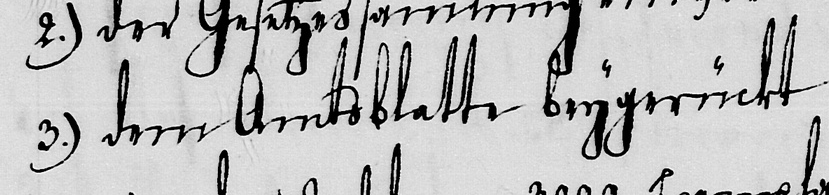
3.) dem Amtsblatte beygerückt
